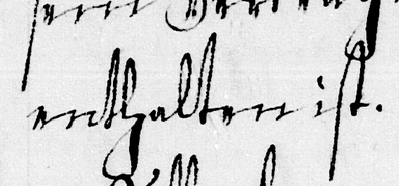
enthalten ist.
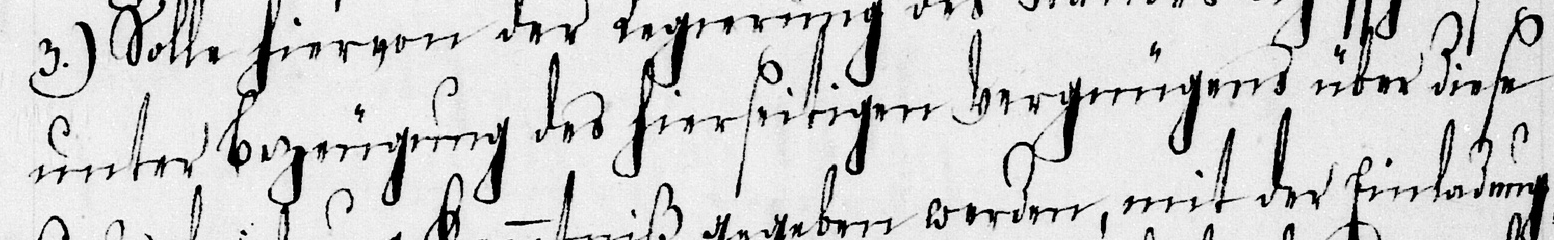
unter Bezeugung des hierseitigen Vergnügens über diese
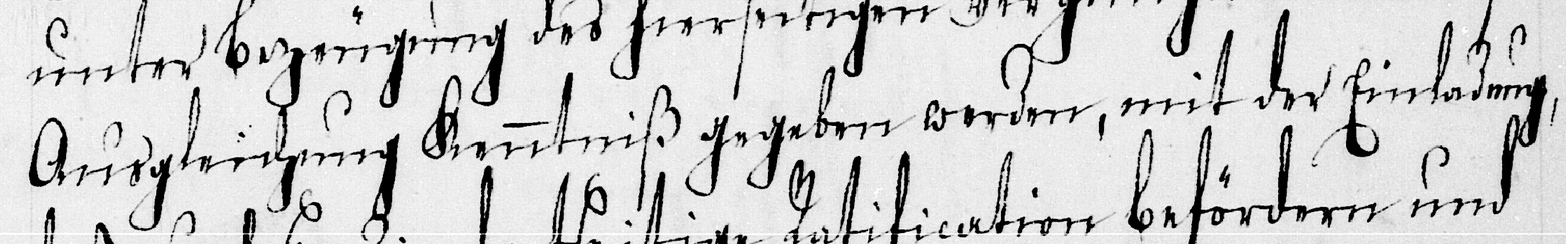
Ausgleichung Kenntniß gegeben werden, mit der Einladung
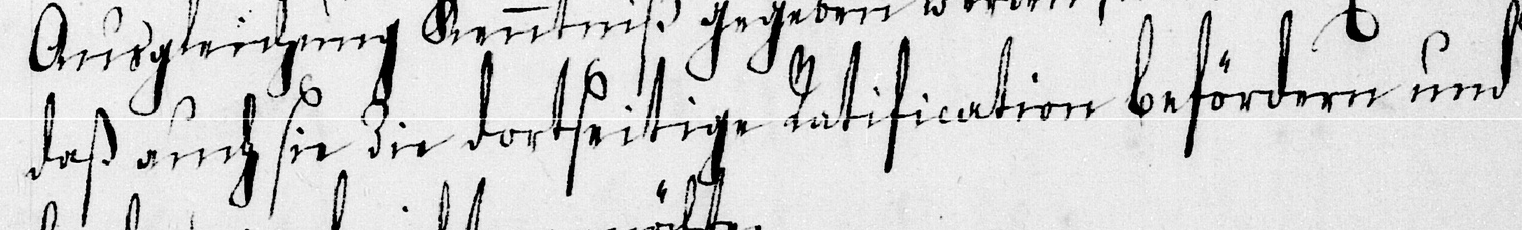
daß auch sie die dortseitige Ratification befördern und
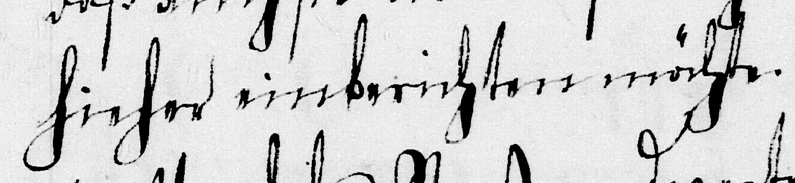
hieher einberichten möchte.
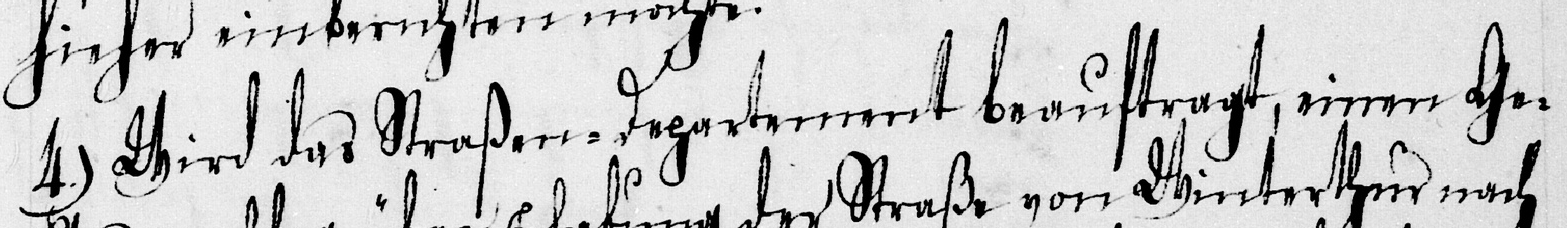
4.) Wird das Straßen-Departement beauftragt, einen Ge¬
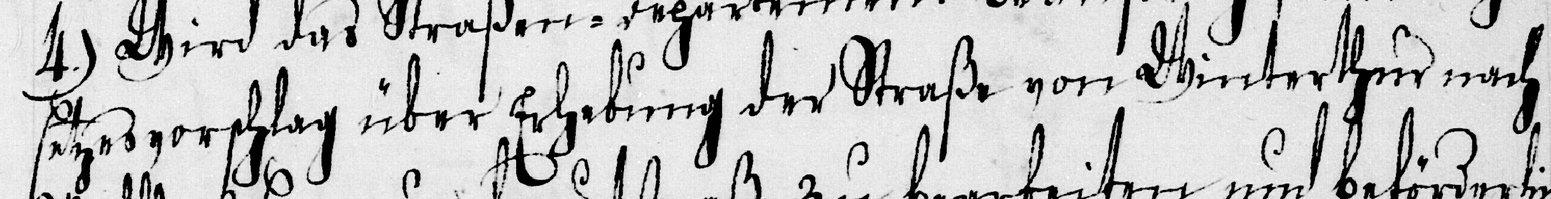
setzesvorschlag über Erhebung der Straße von Winterthur nach
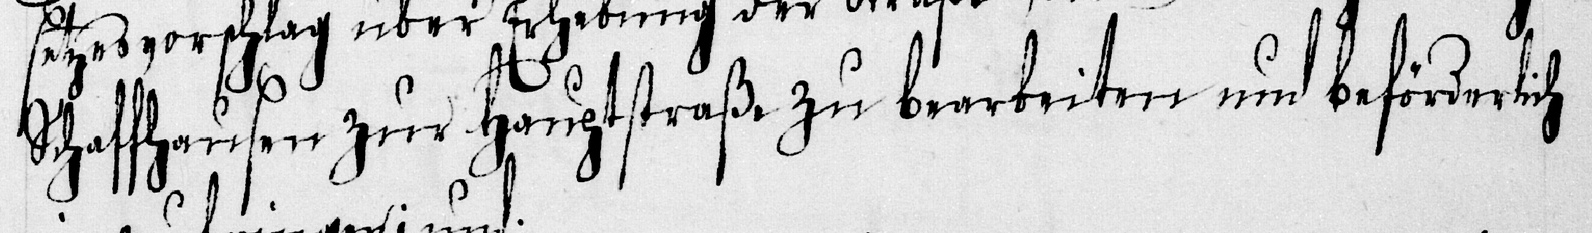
Schaffhausen zur Hauptstraße zu bearbeiten und beförderlich
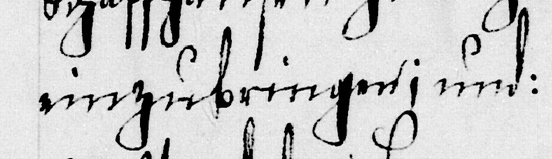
einzubringen; und:
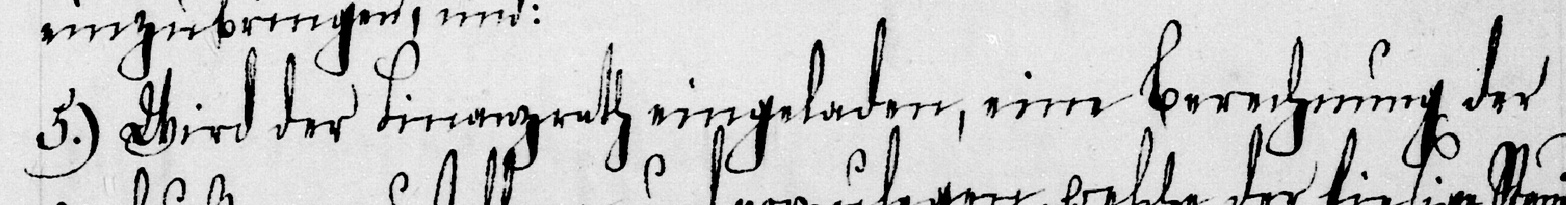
5.) Wird der Finanzrath eingeladen, eine Berechnung der
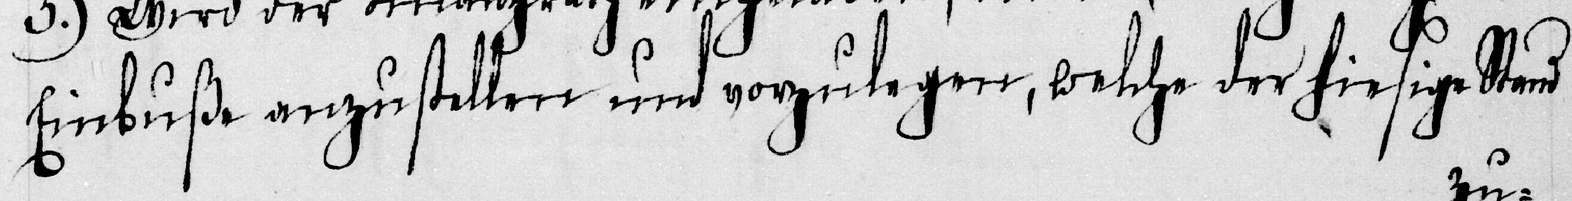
Einbuße anzustellen und vorzulegen, welche der hiesige Stand
